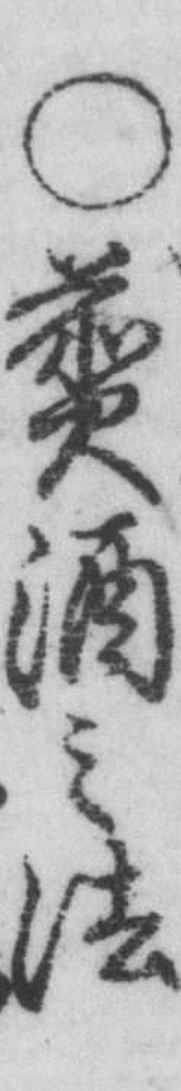〇煎酒之法
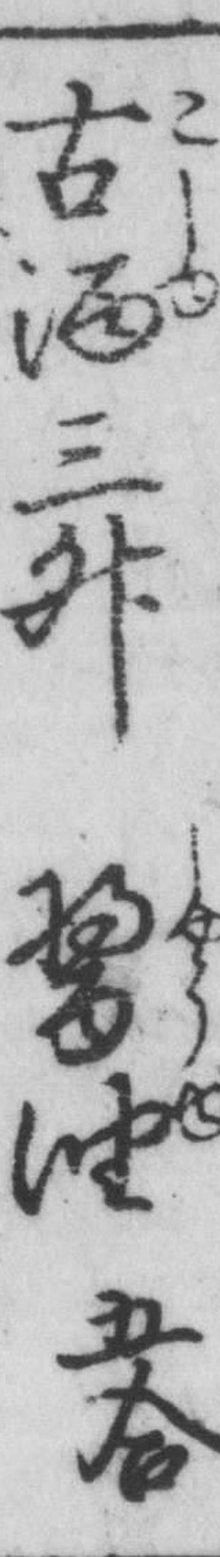古酒三升醤油五合
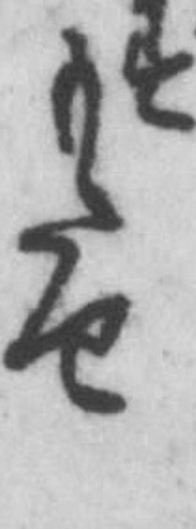もたせ
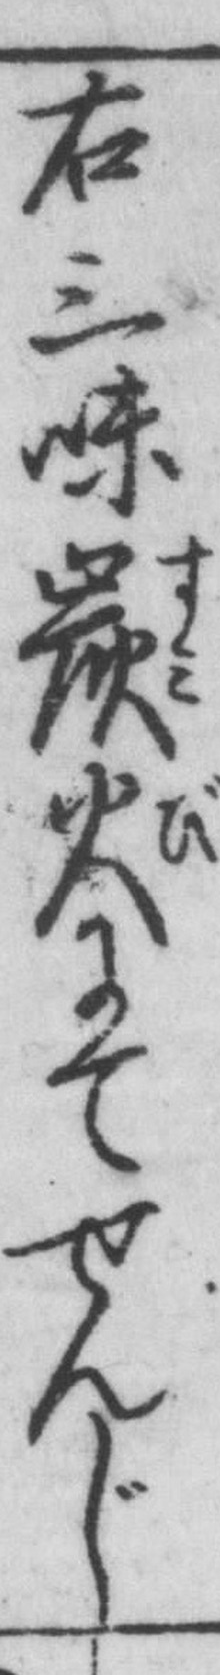右三味炭火にてせんじ
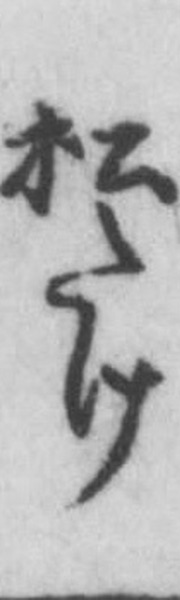平たけ
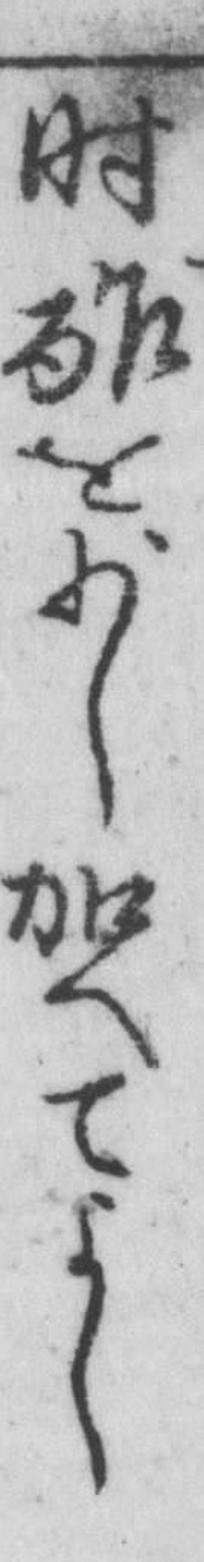時酢を少し加へてよし
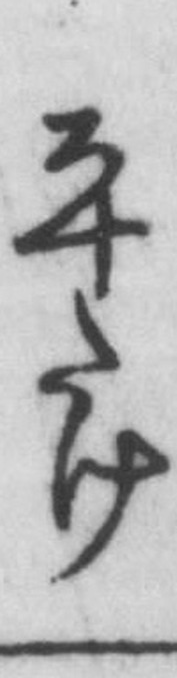平たけ
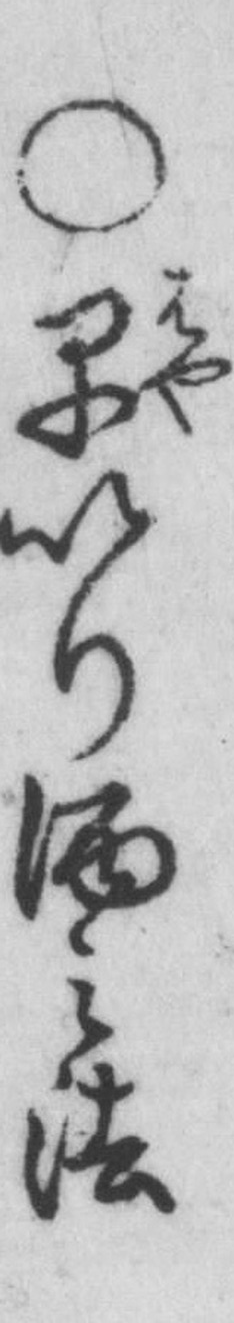〇早煎酒之法
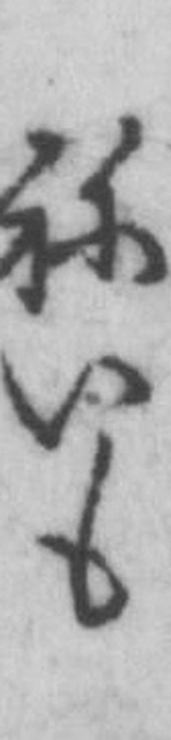長いも
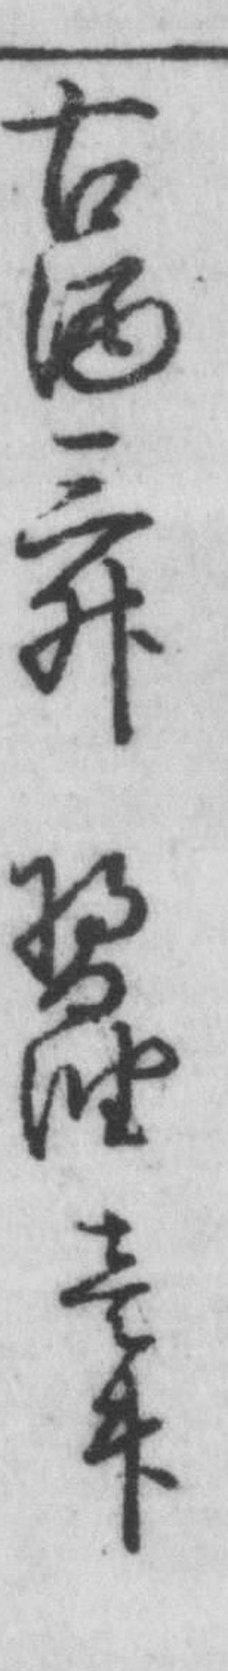古酒三升醤油一升
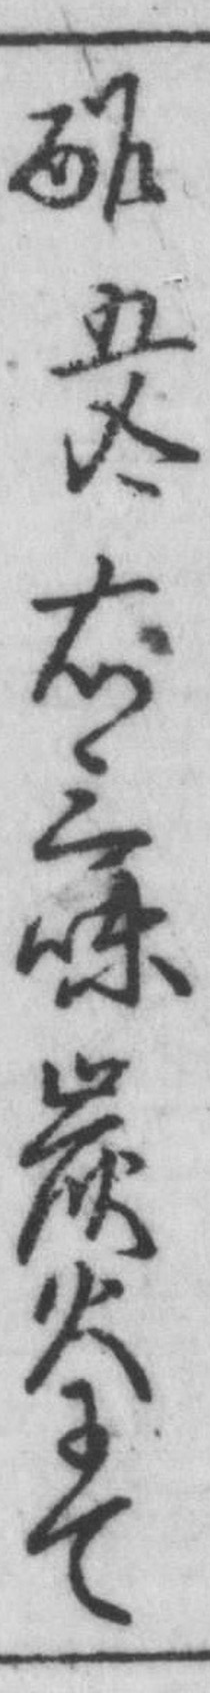酢五合右三味炭火にて
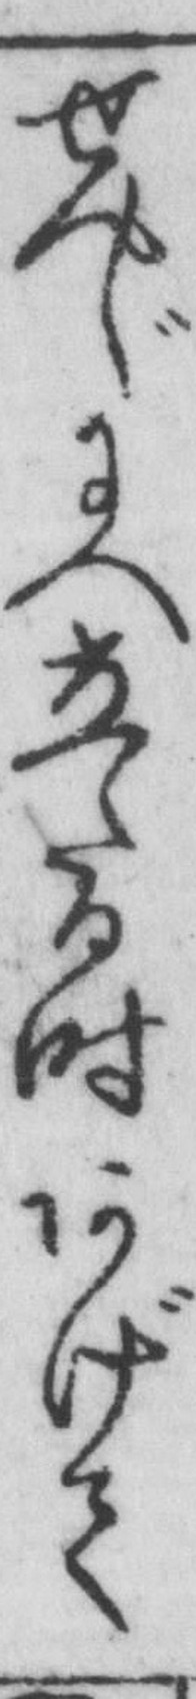せんじにへ立たる時あげて
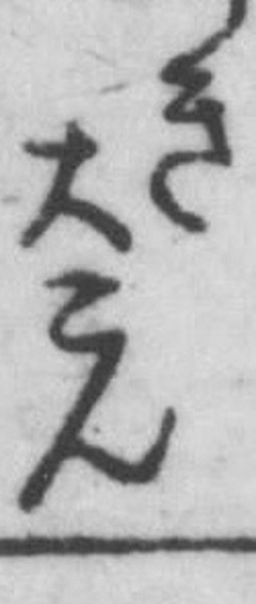大こん
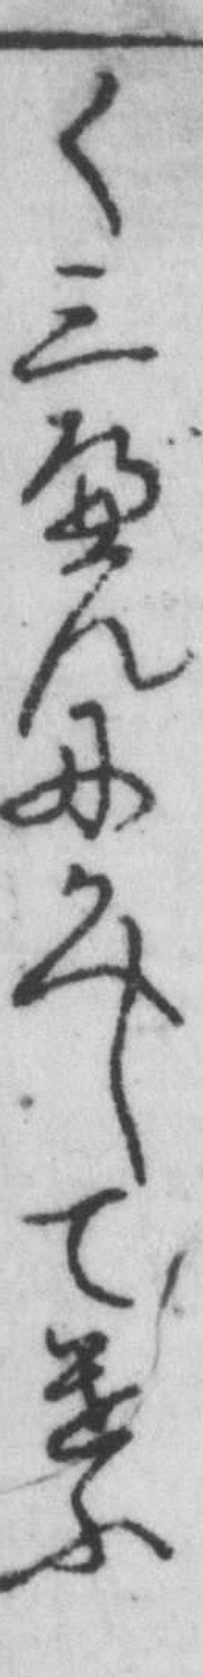く三べんにかへして遣ふ

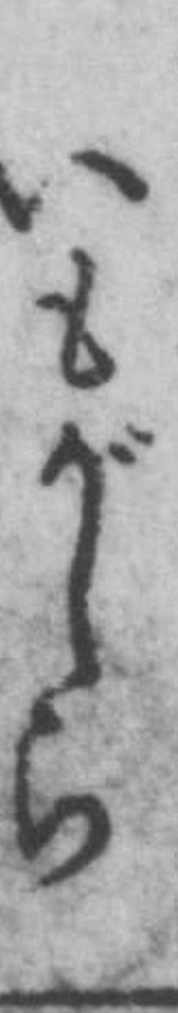いもがしら
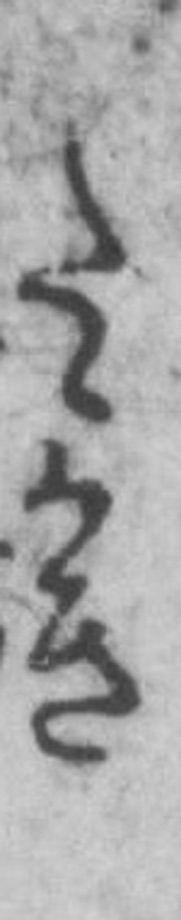たゝかき
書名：料理献立抄
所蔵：大阪府立大学学術情報センター 国文学研究資料館
